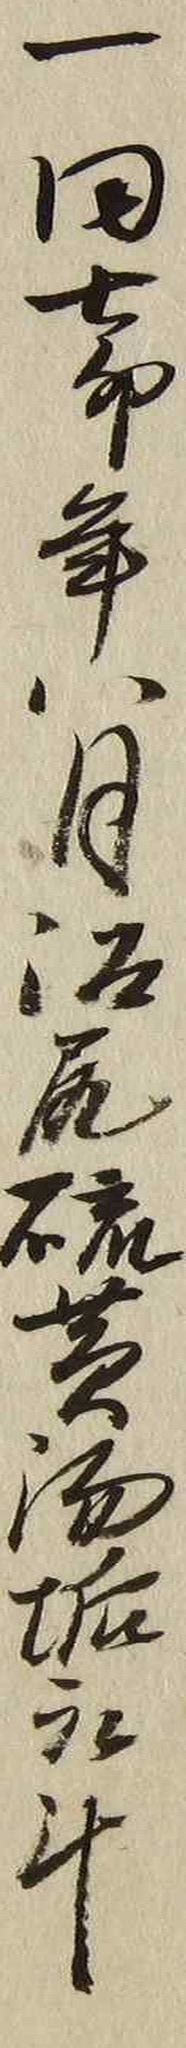一同七卯年八月沼尻硫黄湯垢取計
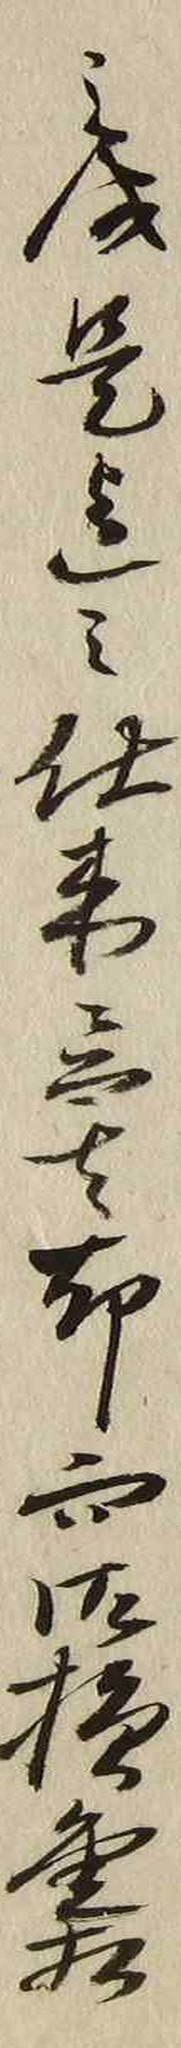之儀是迄之仕来ニ而者却而御損金相
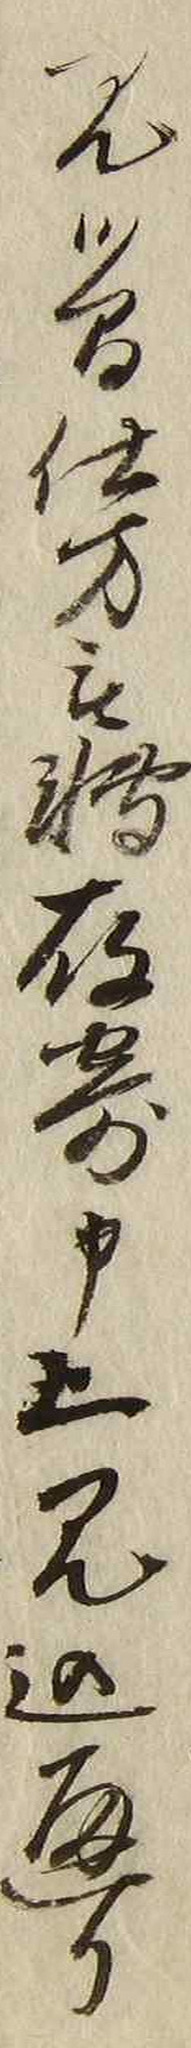見候間仕方被転存寄申上見込通り
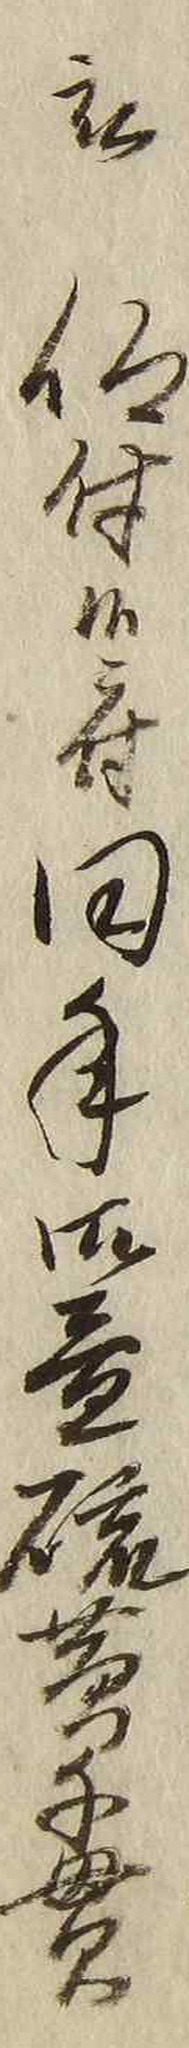被仰付候ニ付同年御益硫黄千貫

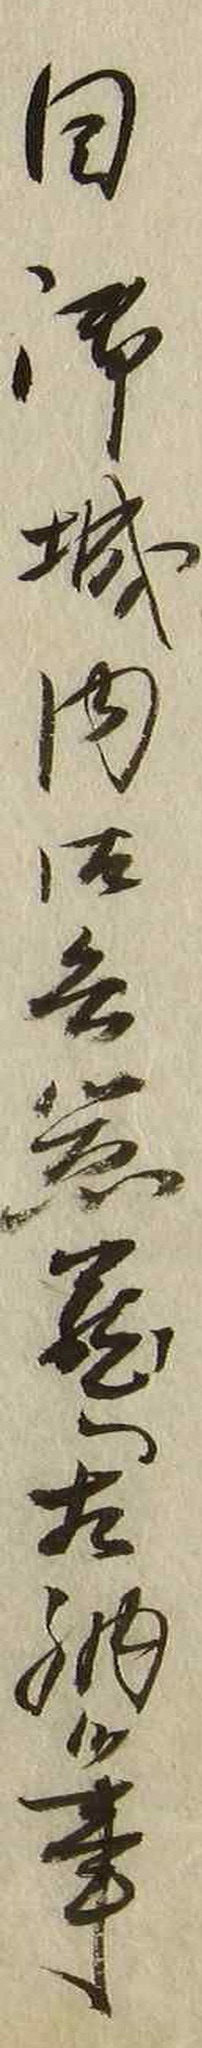目御城内御兵器蔵へ相納候事
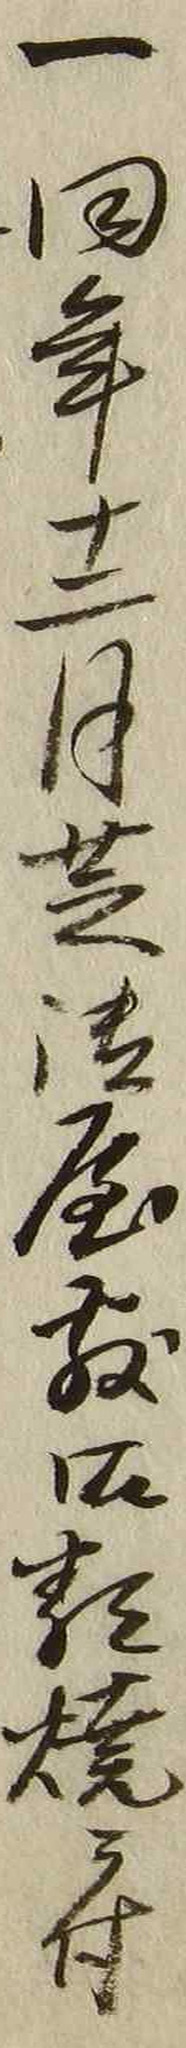一同年十二月芝御屋敷御類焼ニ付
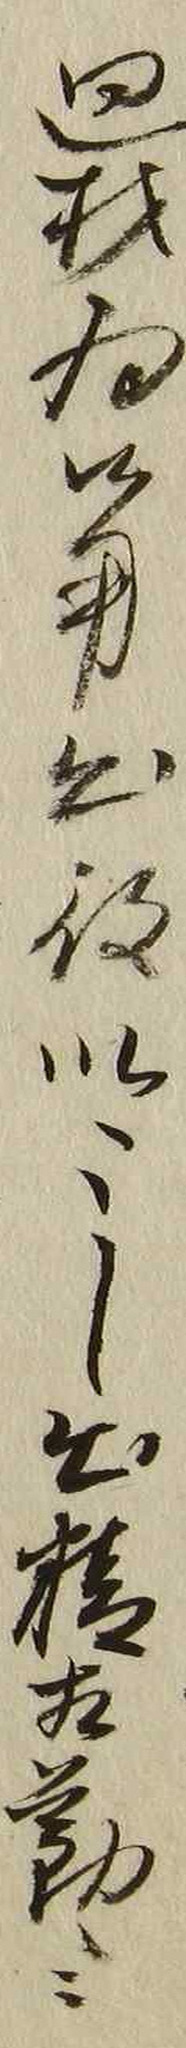廻材為御用出役いたし出精相勤候ニ
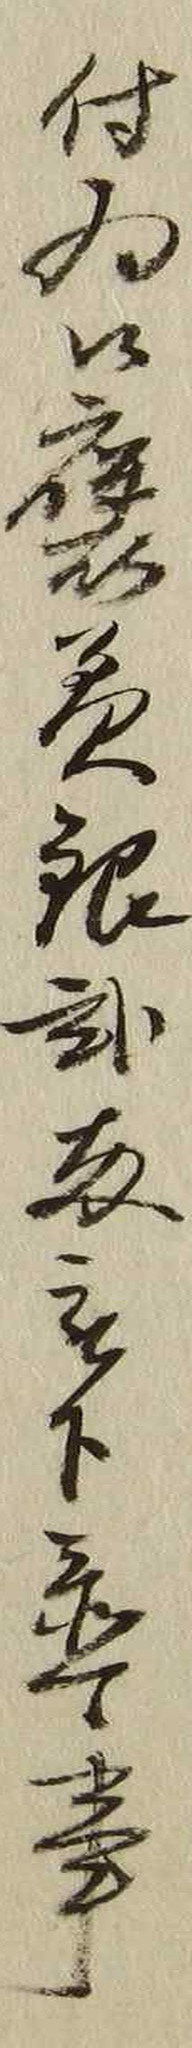付為御褒美銀弐両被下置候事
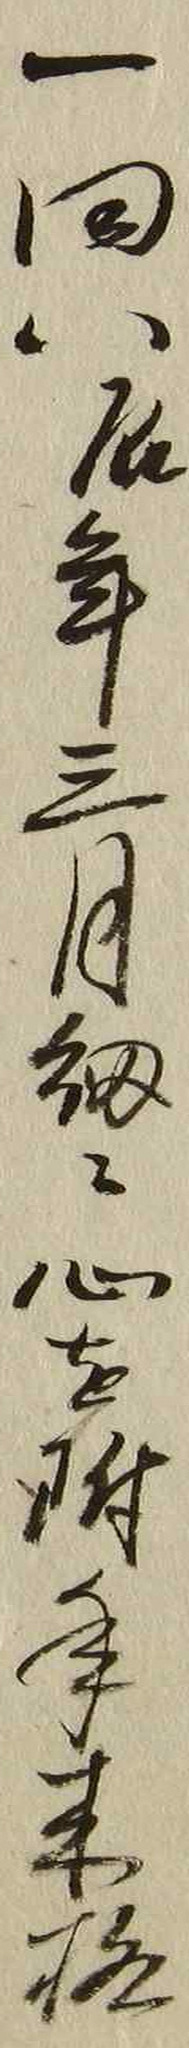一同八辰年三月細々心を附年来格
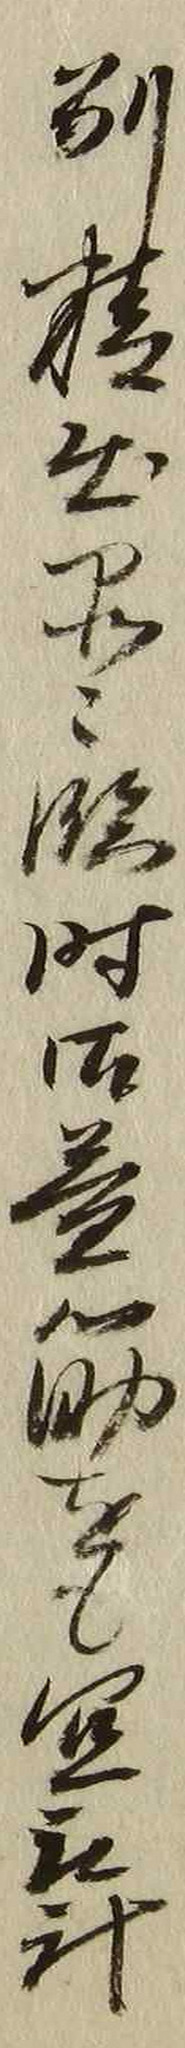別精出品々臨時御益筋をも宜取計
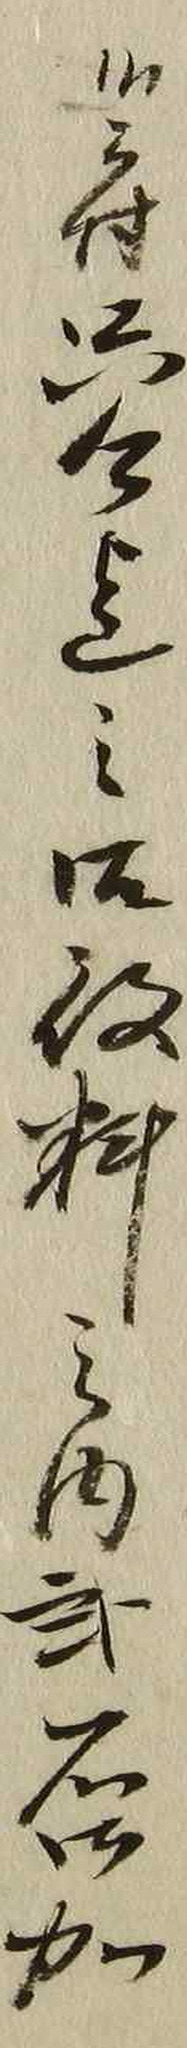候ニ付只今迄之御役料之内弐石御加
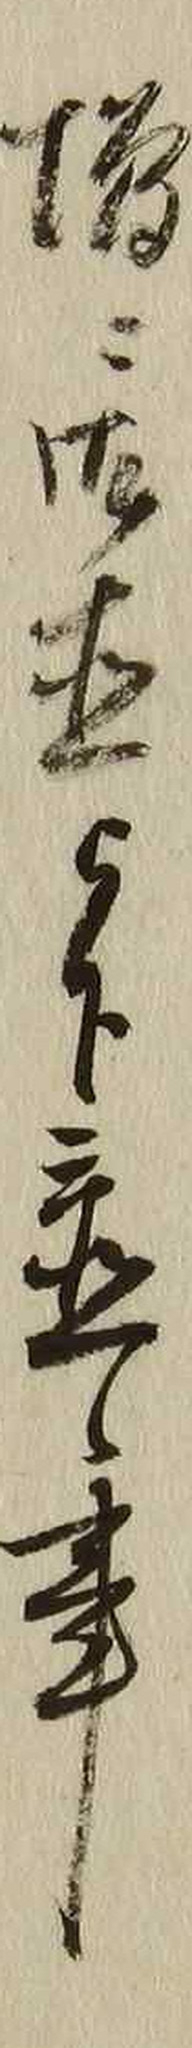増ニ御直被下置候事
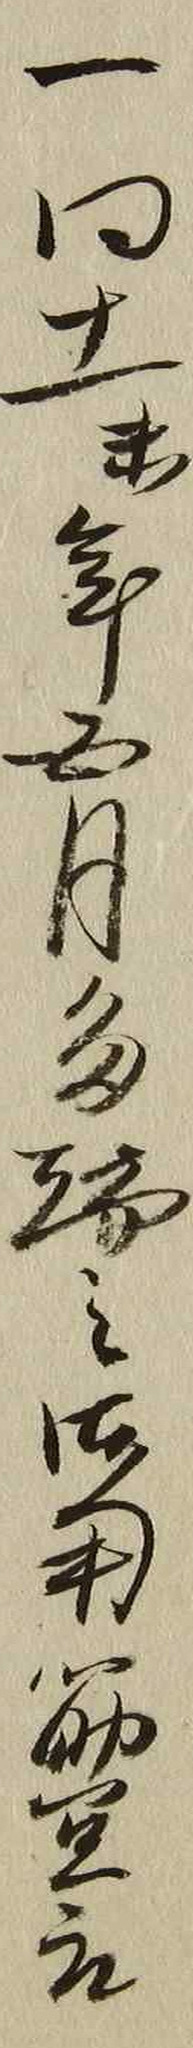一同十一未年五月多端之御用筋宜取
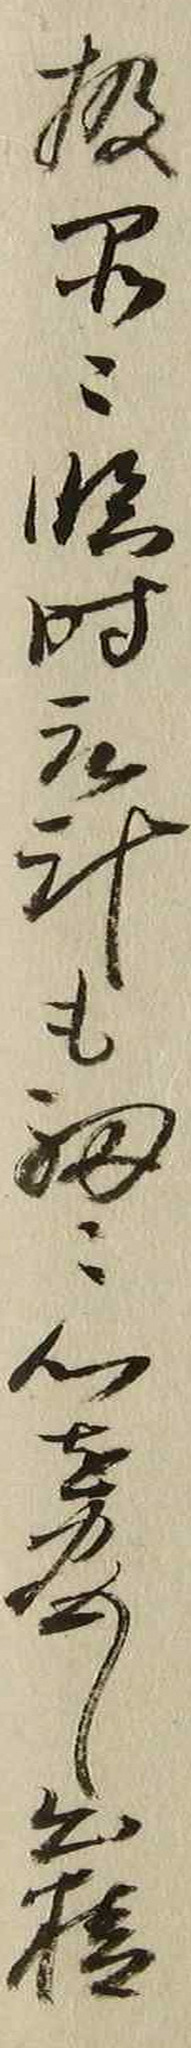扱品々臨時取計も細々心を尽し出精
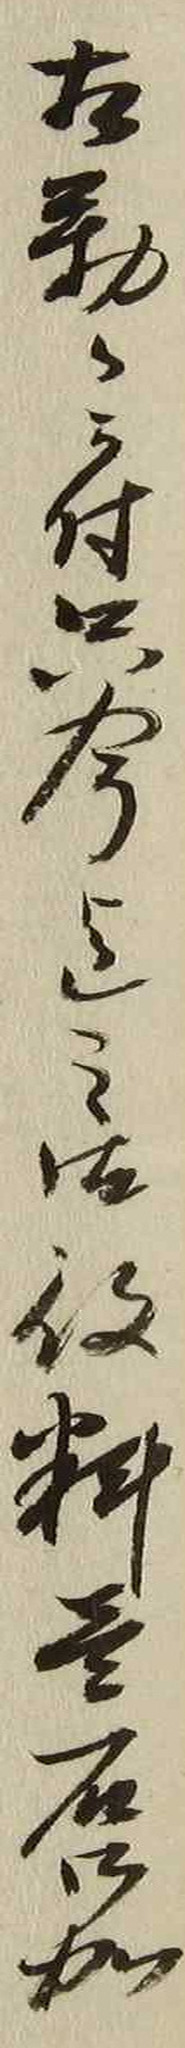相勤候ニ付只今迄之御役料壱石御加
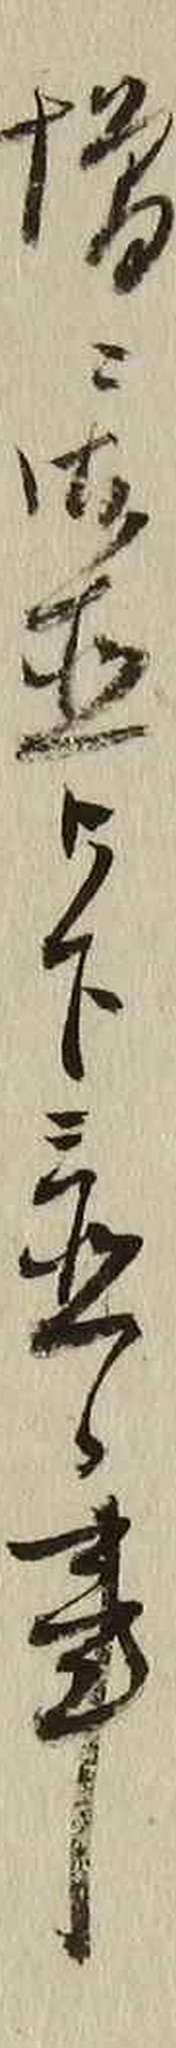増ニ御直被下置候事
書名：諸士系譜　巻之352　す之部2
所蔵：会津若松市立会津図書館
